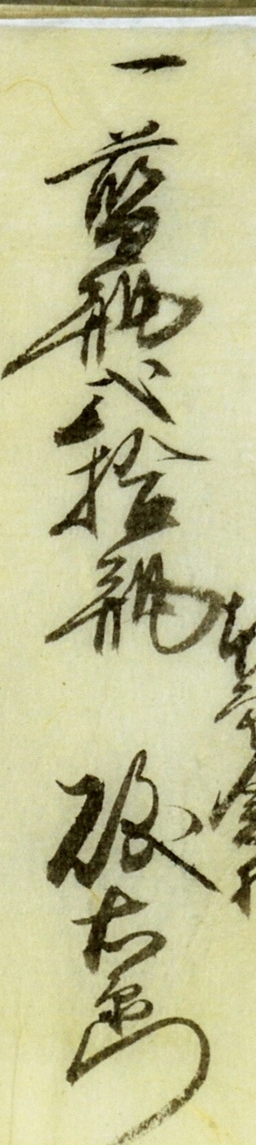一藍瓶弐拾瓶磯右衛門
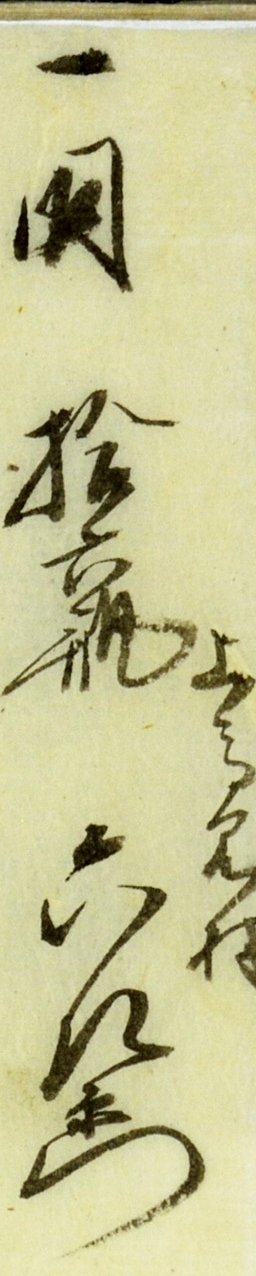一同拾六瓶六左衛門
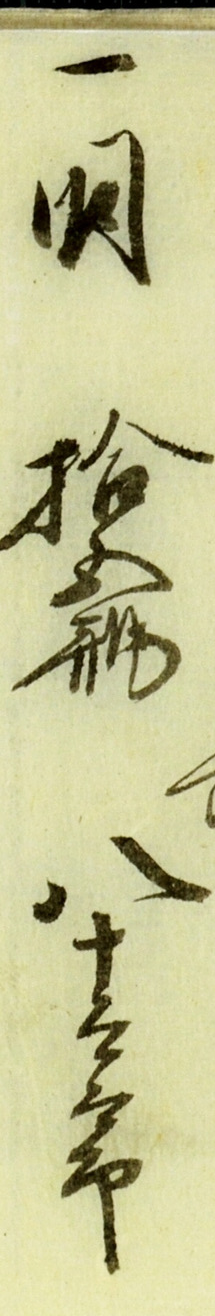一同拾五瓶八十太郎
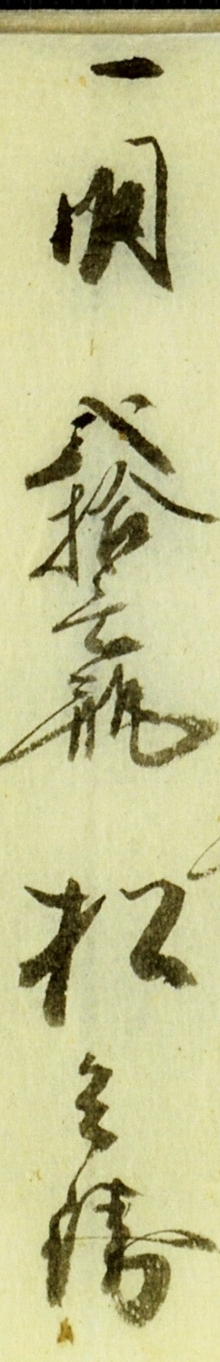一同弐拾壱瓶松兵衛
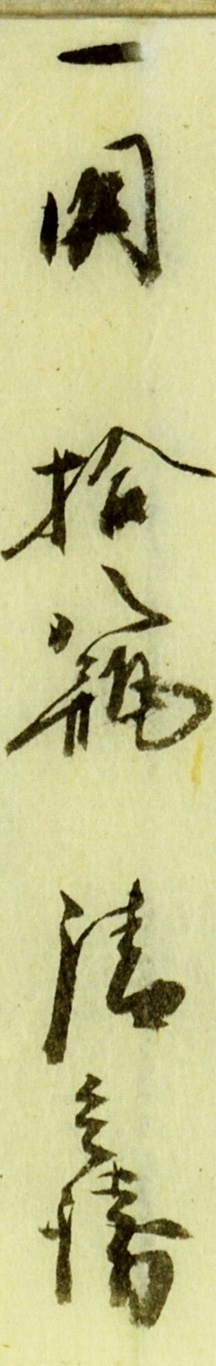一同拾八瓶清兵衛
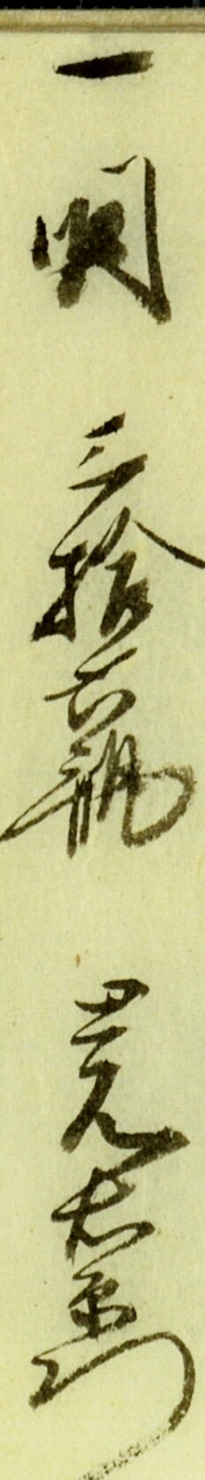一同三拾六瓶覚右衛門
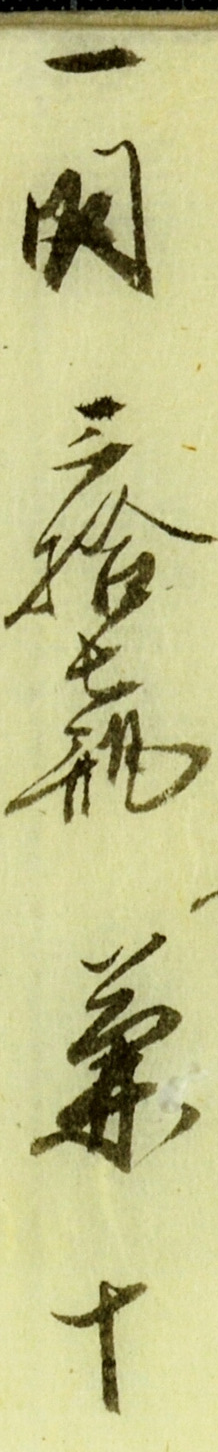一同三拾七瓶兼十
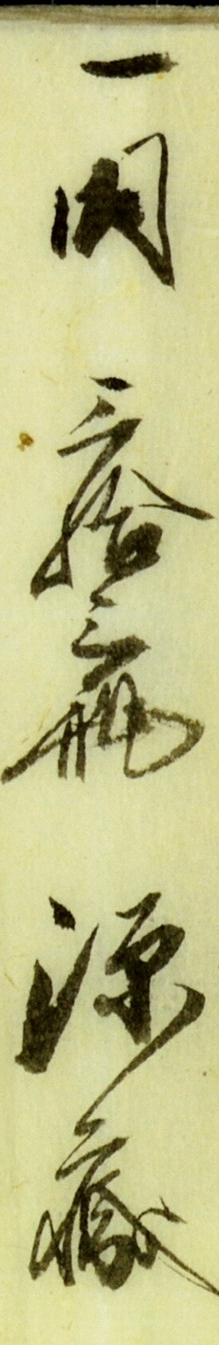一同三拾三瓶源蔵

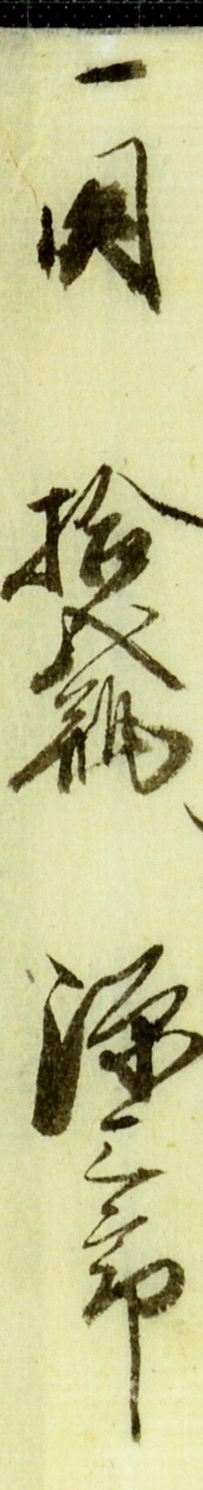一同拾五瓶源三郎
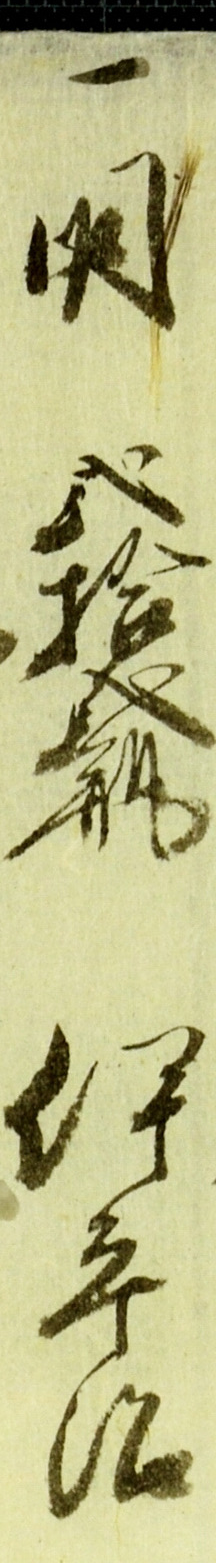一同弐拾弐瓶伊平治
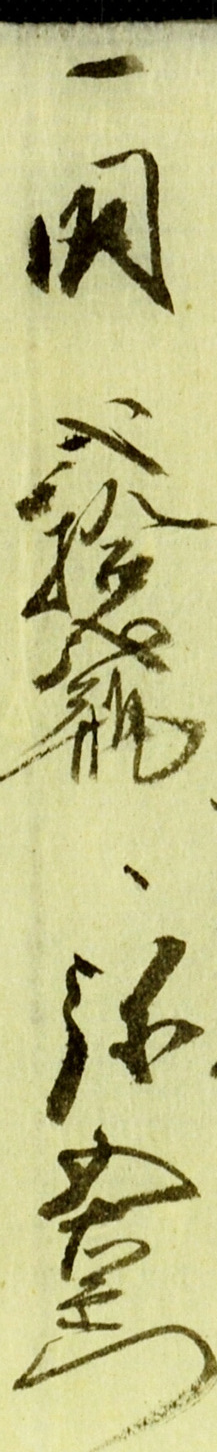一同弐拾弐瓶弥五右衛門
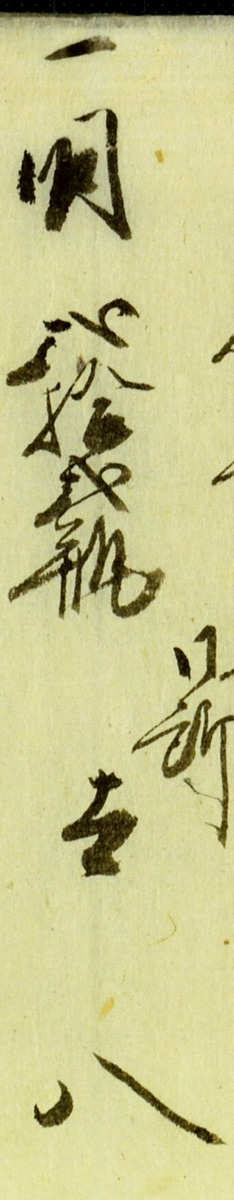一同弐拾弐瓶太八
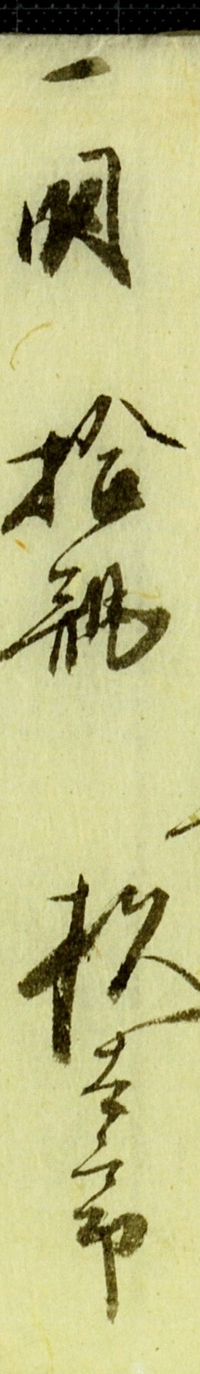一同拾瓶杉太郎
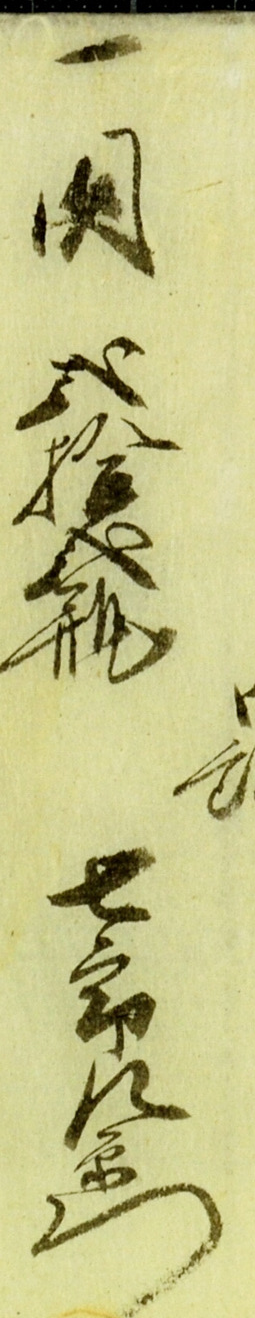一同弐拾弐瓶七郎左衛門
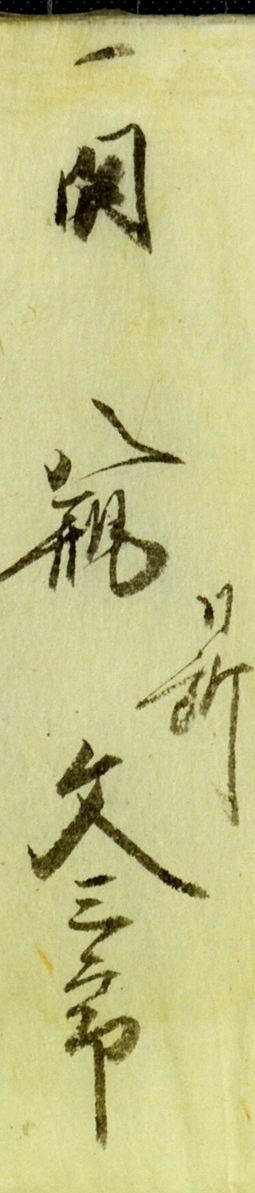一同八瓶文三郎

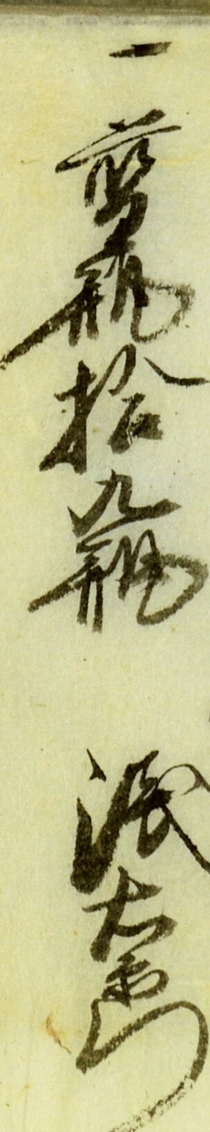一藍瓶拾九瓶儀右衛門
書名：御領分中御領分中紺屋藍瓶員数御改帳
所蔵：伊那市立高遠町図書館・合同会社AMANE
